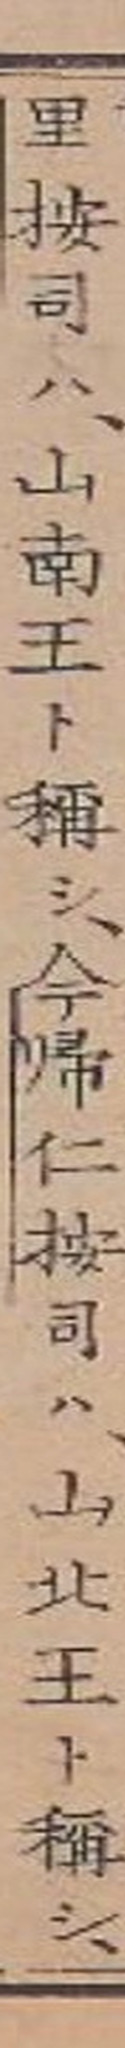里按司ハ、山南王ト称シ、今帰仁按司ハ、山北王ト称シ、
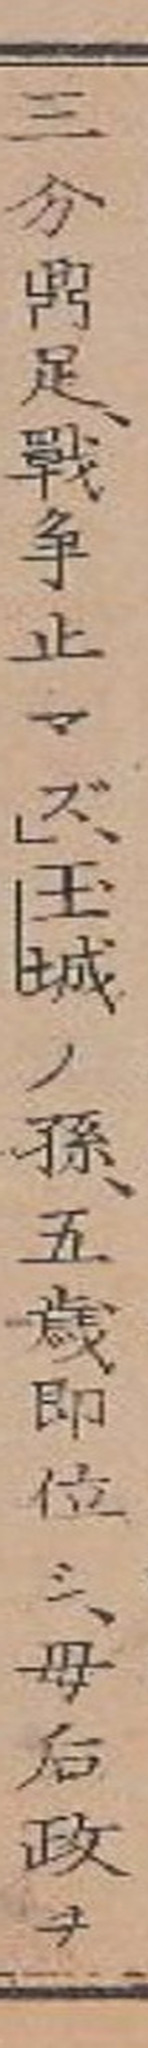三分鼎足、戦争止マズ、」玉城ノ孫、五歳即位シ、母后政ヲ
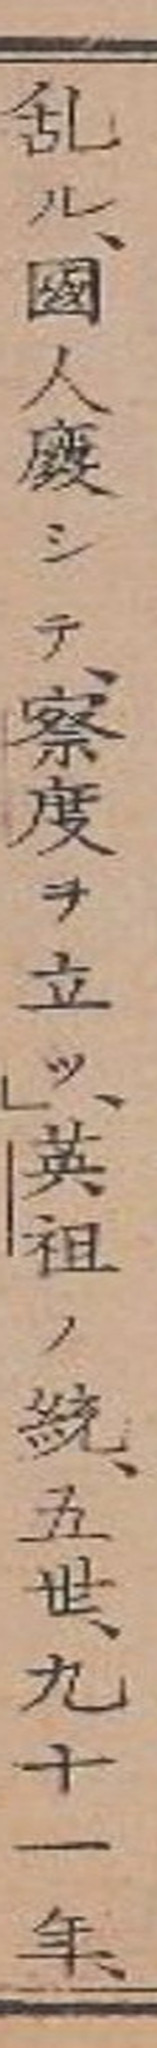乱ル、国人廃シテ、察度ヲ立ツ、」英祖ノ統、五世、九十一年、
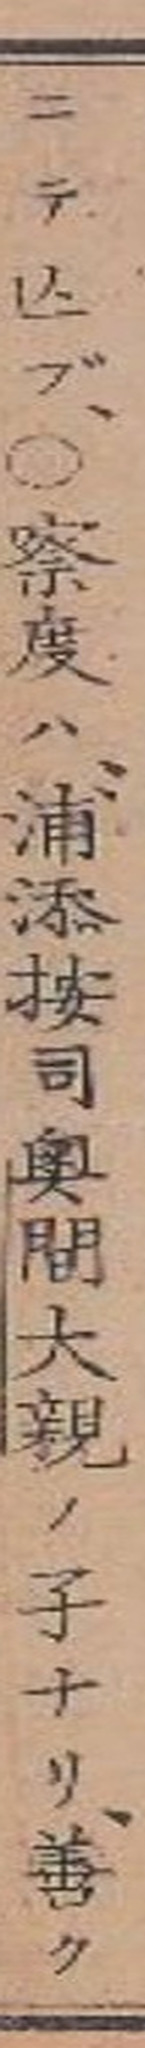ニテ亡ブ、○察度ハ、浦添按司奥間大親ノ子ナリ、善ク

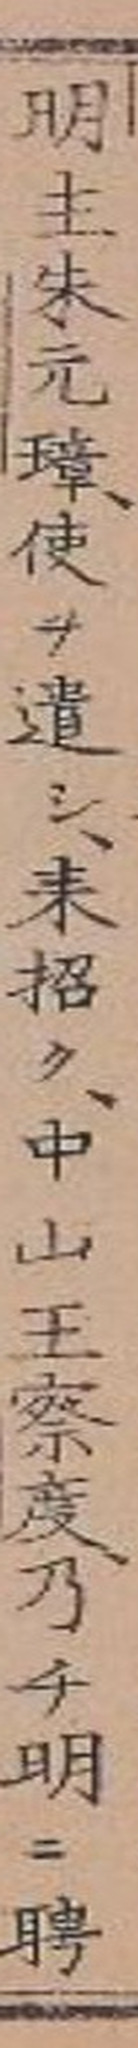明主朱元璋、使ヲ遣シ、来招ク、中山王察度、乃チ明ニ聘
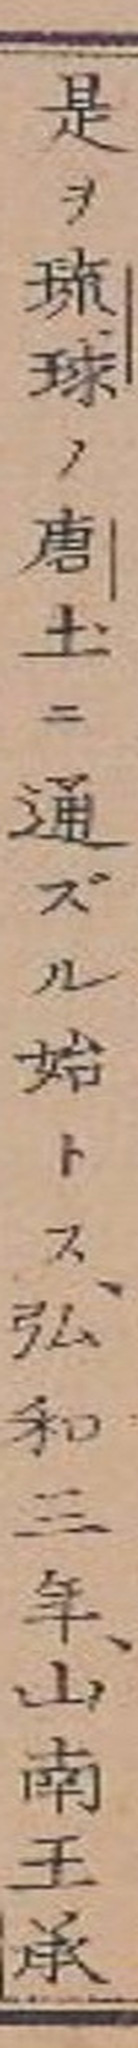是ヲ琉球ノ唐土二通ズル始トス、弘和三年、山南王承
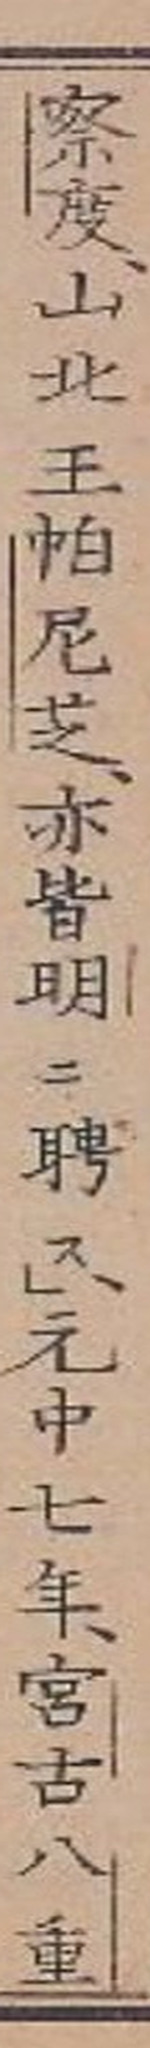察度、山北王帕尼芝、亦皆明ニ聘ス、」元中七年、宮古八重
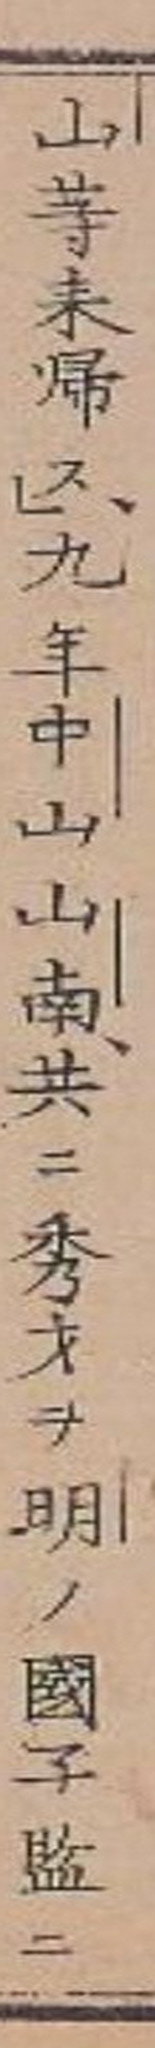山等来帰ス、」九年中山山南、共ニ秀才ヲ明ノ国子監ニ
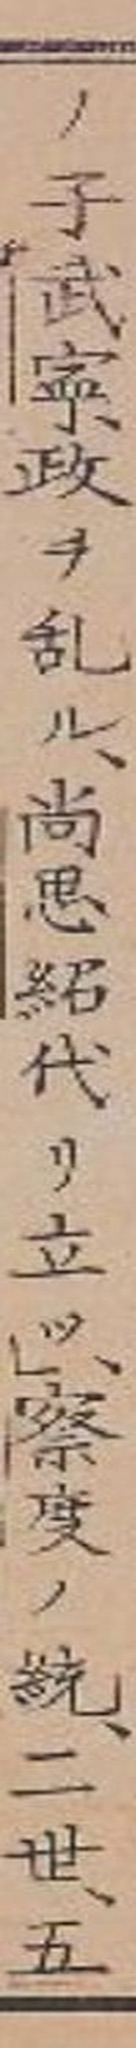ノ子武寧、政ヲ乱ル、尚思紹代リ立ツ、」察度ノ統、二世、五
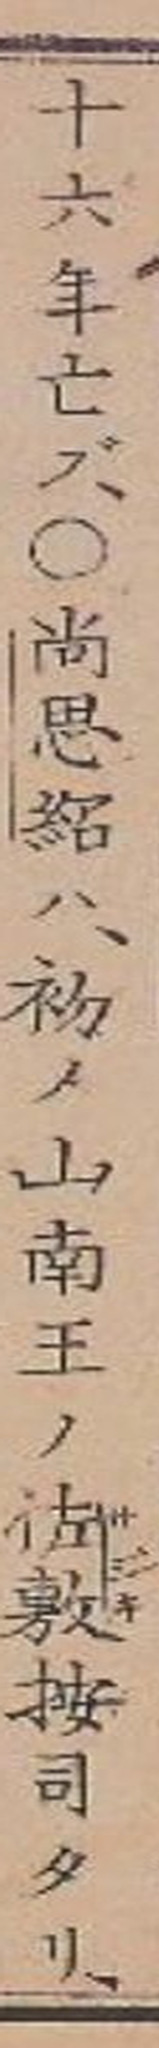十六年亡ブ、○尚思紹ハ、初メ山南王ノ佐敷按司タリ、
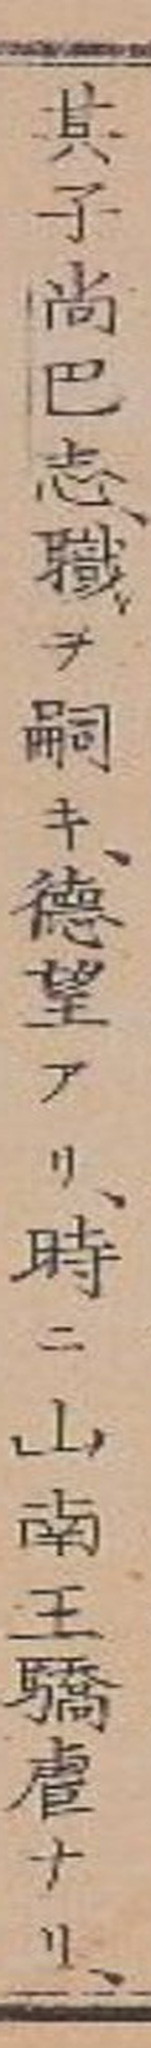其子尚巴志、職ヲ嗣キ、徳望アリ、時ニ山南王驕虐ナリ、
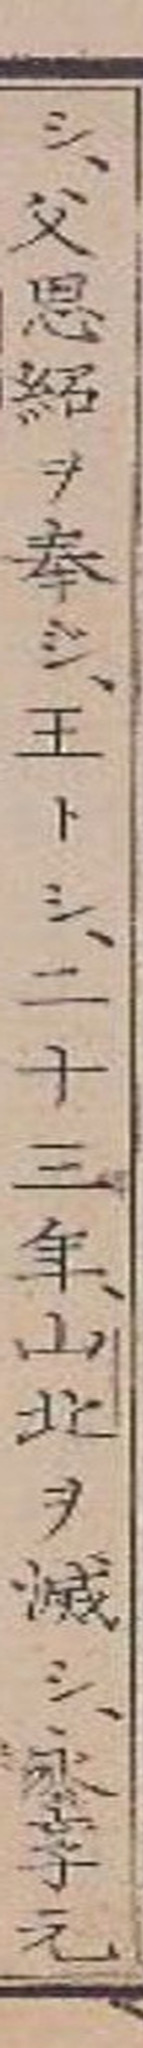シ、父思紹ヲ奉ジ、王トシ、二十三年、山北ヲ滅シ、永享元
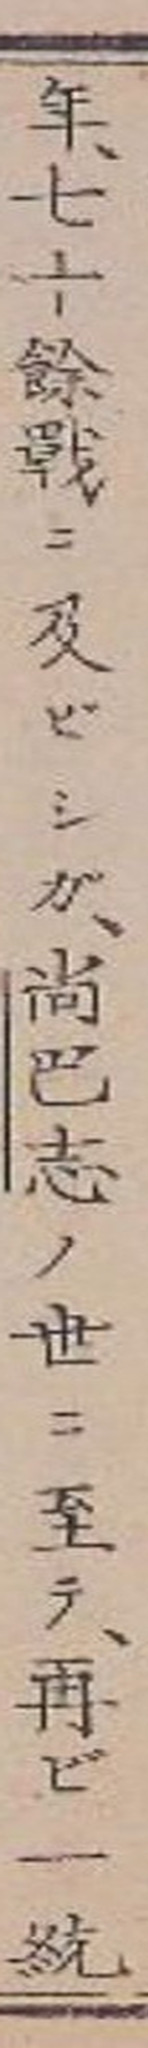年、七十余戦ニ及ビシガ、尚巴志ノ世ニ至テ、再ビ一統
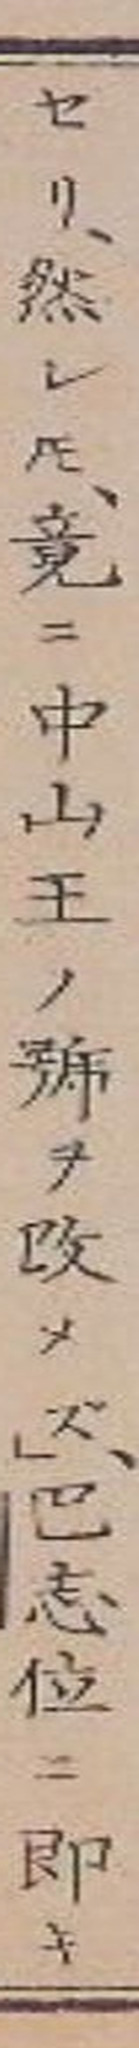セリ、然レトモ、竟ニ中山王ノ号ヲ改メズ、」巴志位ニ即キ
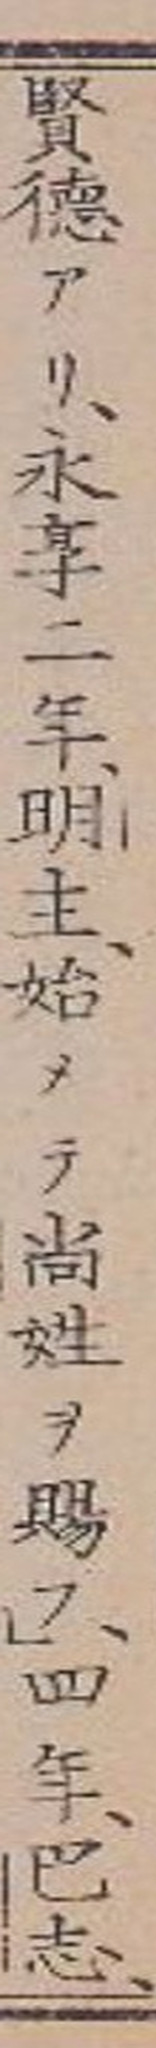賢徳アリ、永享二年、明主、始メテ尚姓ヲ賜フ、」四年、巴志、
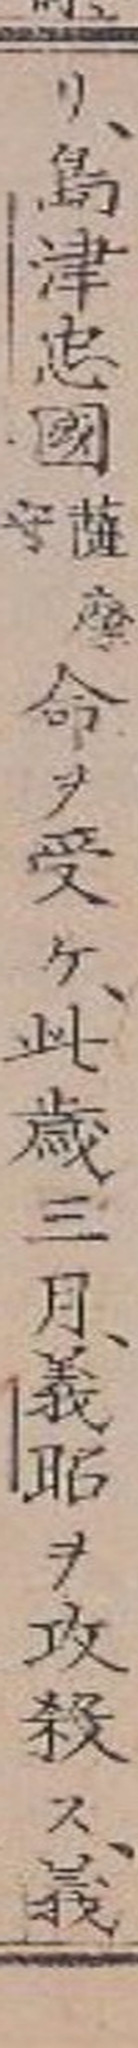リ、島津忠国薩摩守命ヲ受ケ、此歳三月、義昭ヲ攻殺ス、義
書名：琉球新誌 巻上
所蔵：University of the Ryukyus Library
